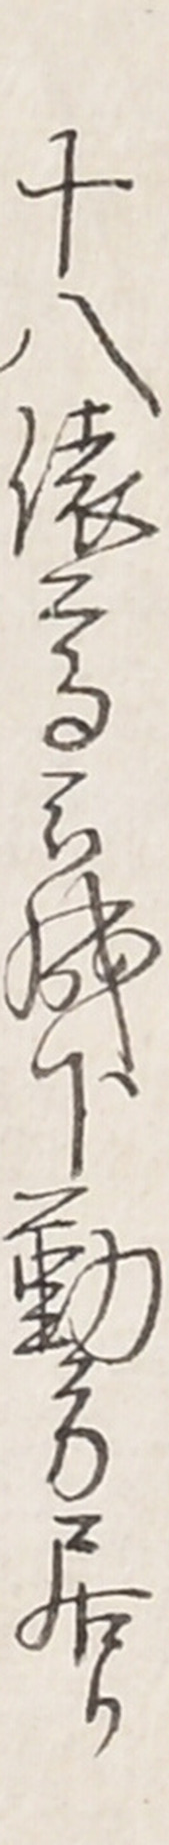十八俵高被成下勤方居り
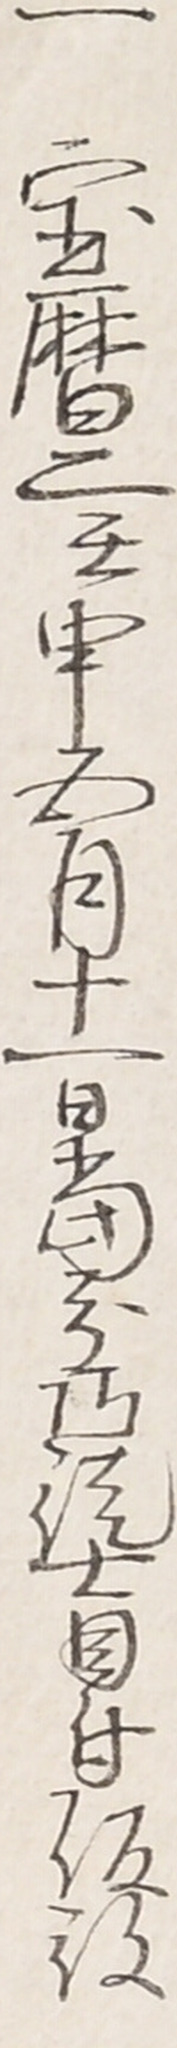一宝暦ニ壬申五月十一日当分御徒士目付仮役
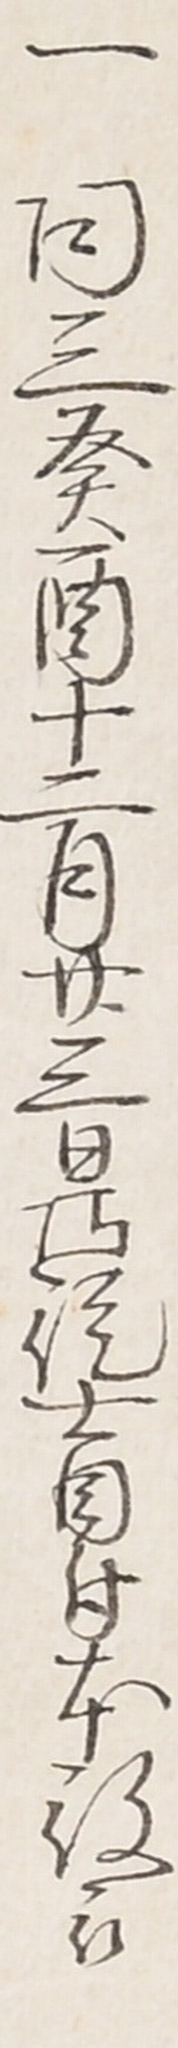一同三癸酉十二月廿三日御徒士目付本役被
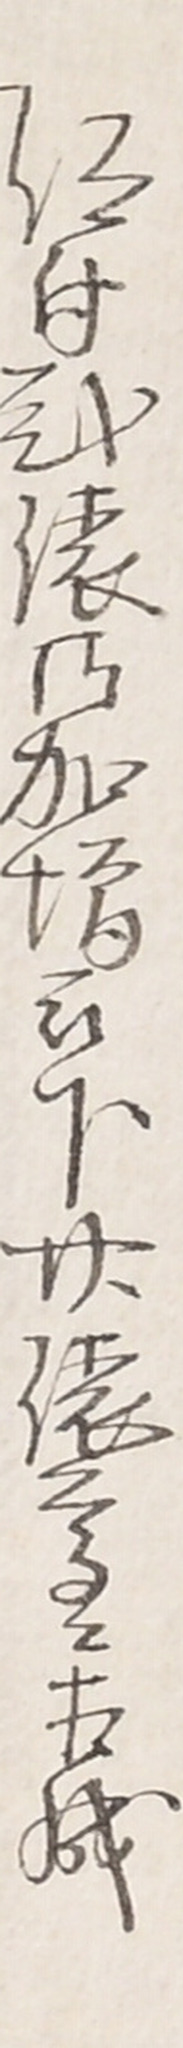仰付弐俵御加増被下廿俵高ニ相成
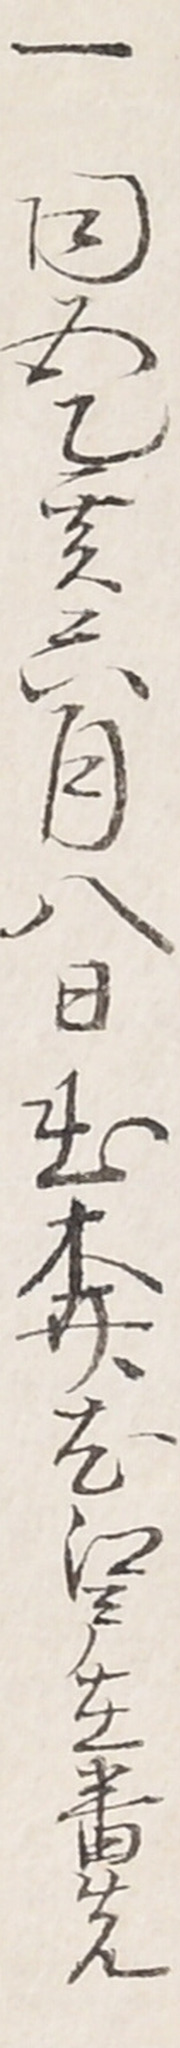一同五乙亥六月八日出奔尤江戸在番先
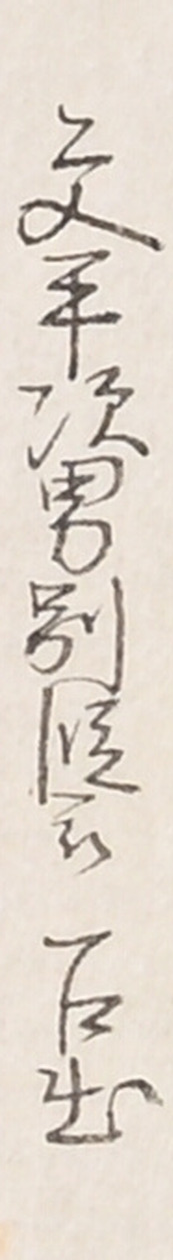文平次男別段被召出
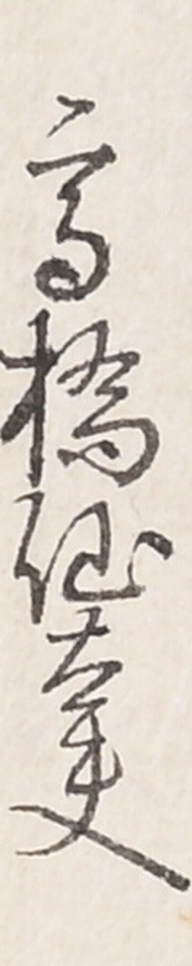高橋仙太夫
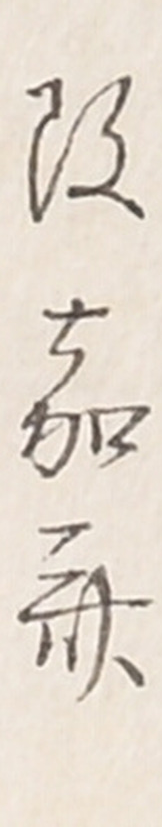改嘉斎
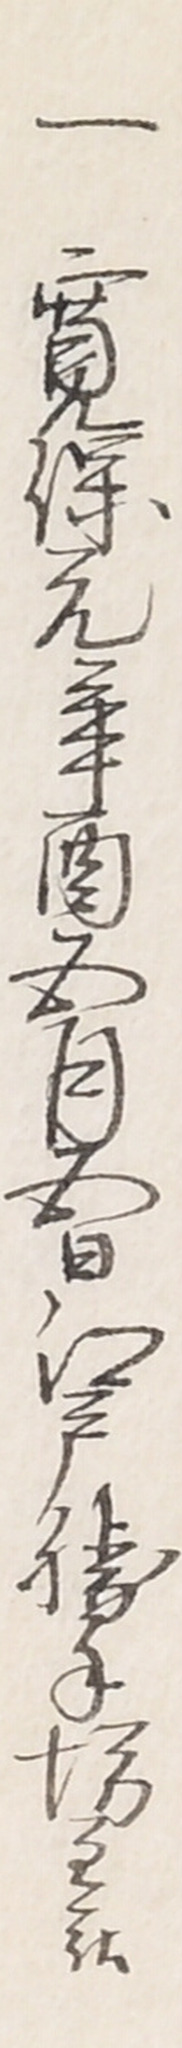一寛保元年酉五月五日江戸勝手坊主被
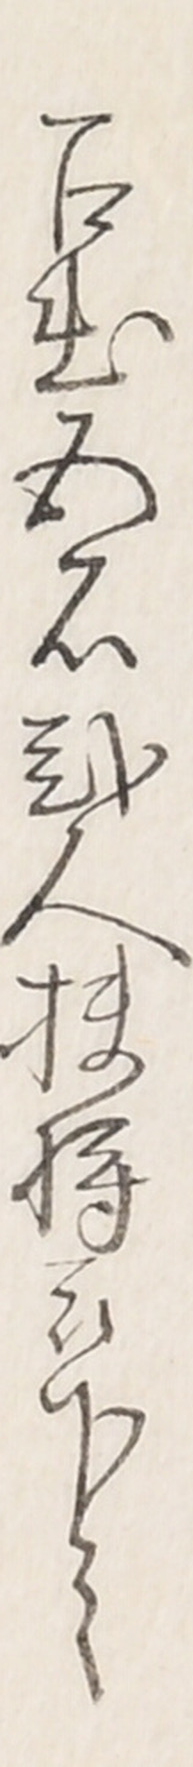召出五石弐人扶持被下之
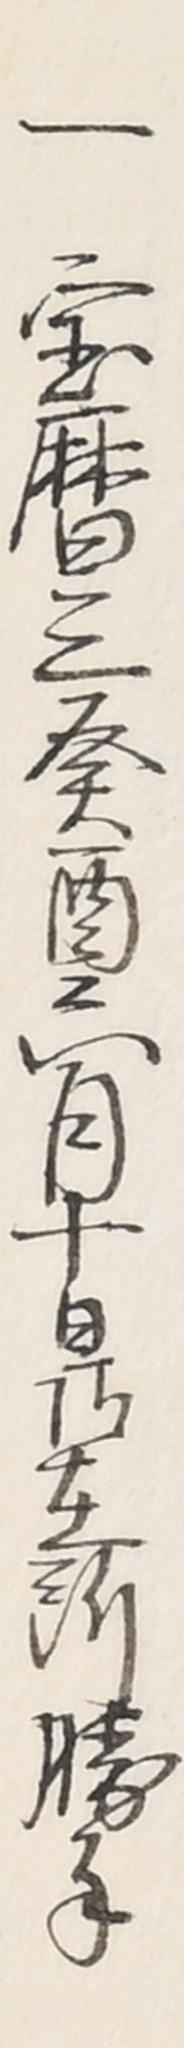一宝暦三癸酉六月十日御在所勝手
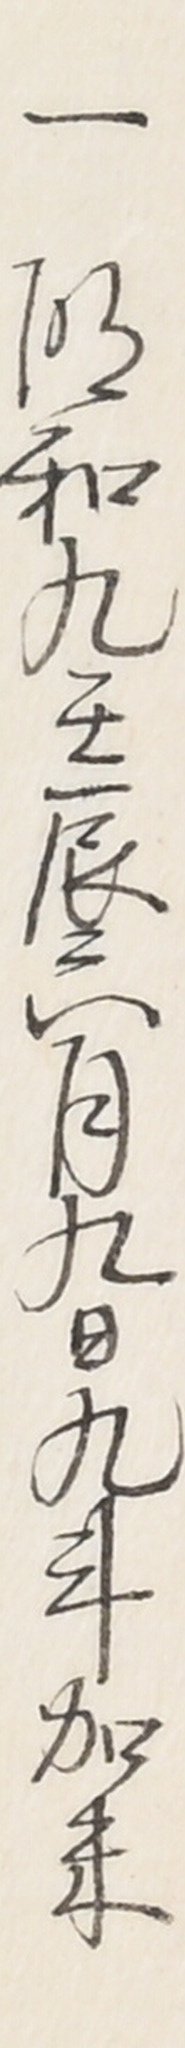一明和九壬辰六月九日九斗加米
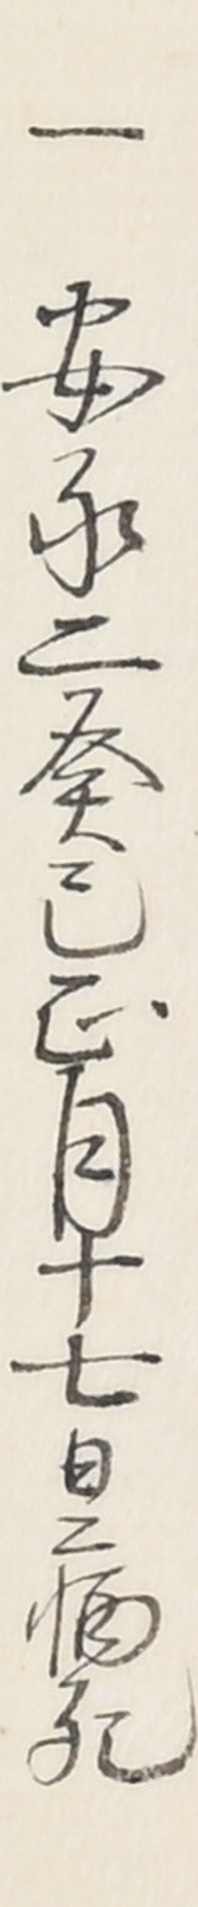一安永二癸巳正月十七日病死
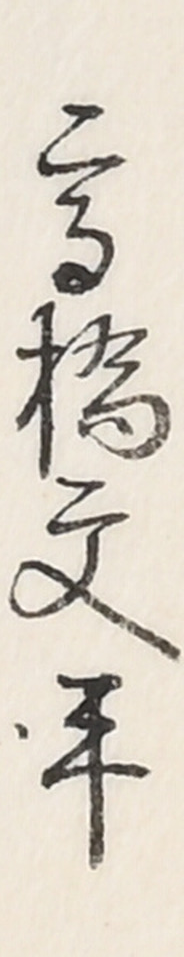高橋文平
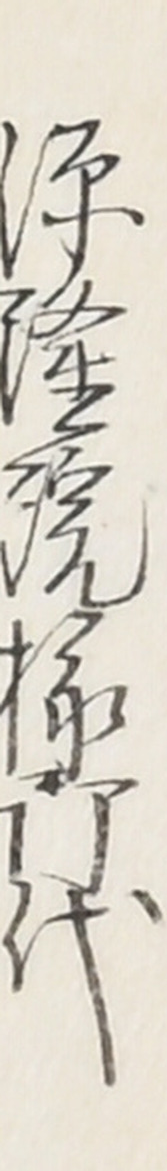源隆院様御代
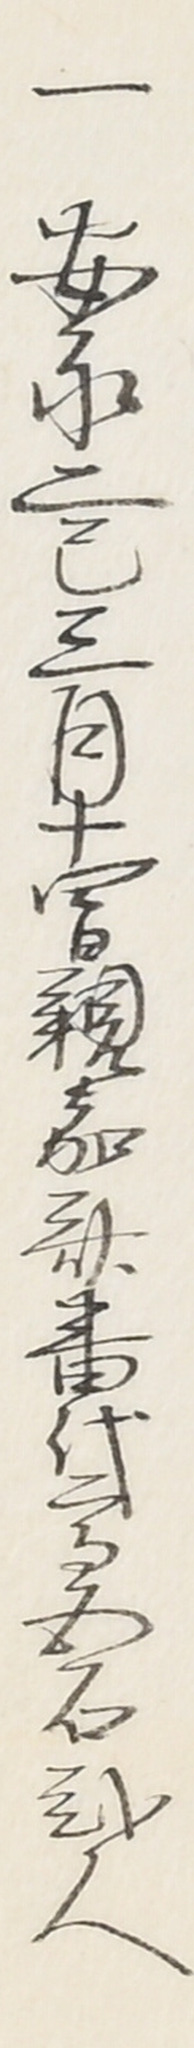一安永二巳三月十四日親嘉斎番代高五石弐人
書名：無足諸士勤仕録（四）
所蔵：伊那市立高遠町図書館・合同会社AMANE
